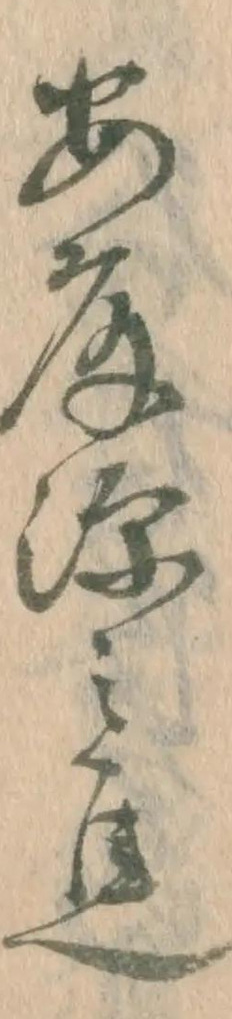安藤源之進
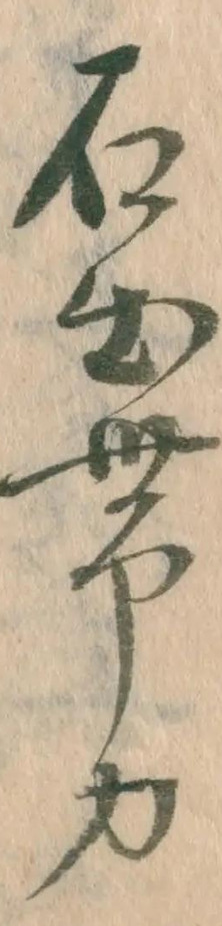石出帯刀
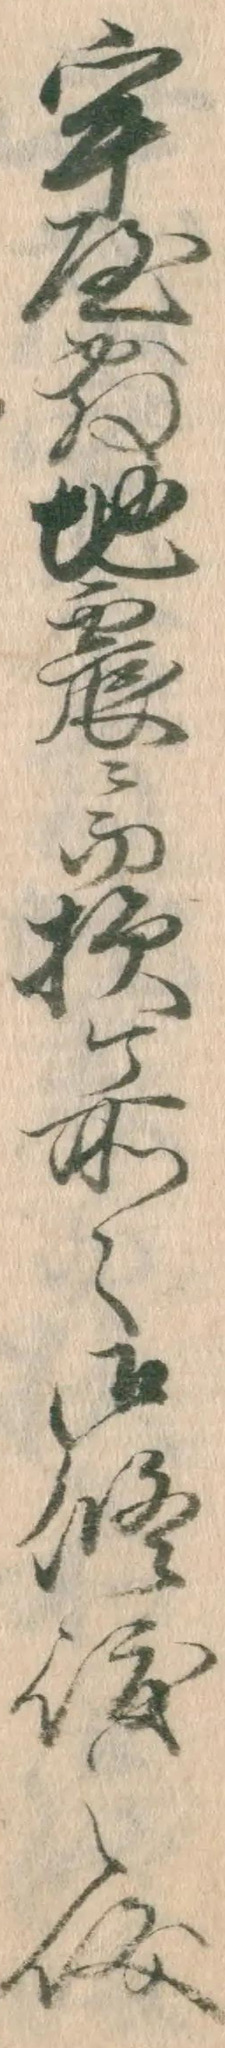牢屋敷地震ニて損ケ所之御修復之儀
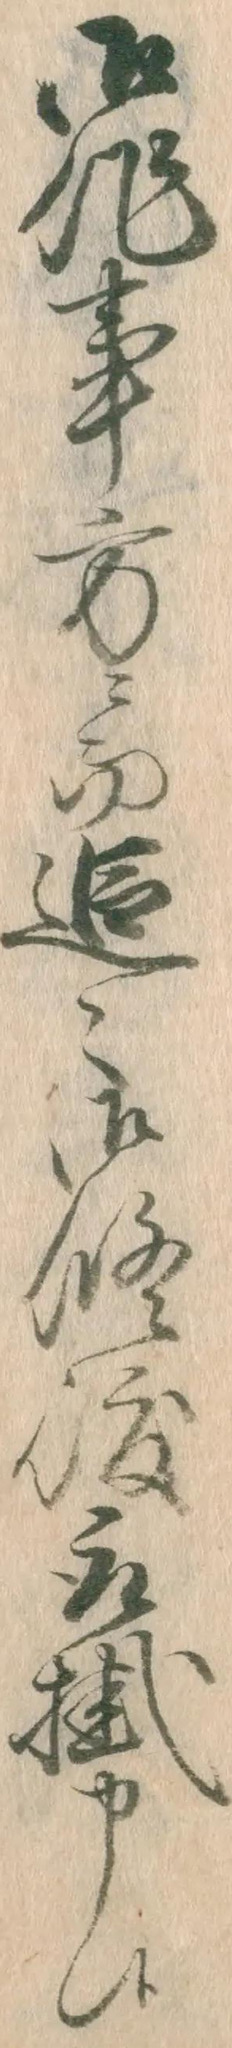御作事方ニて追〻御修復取掛申候

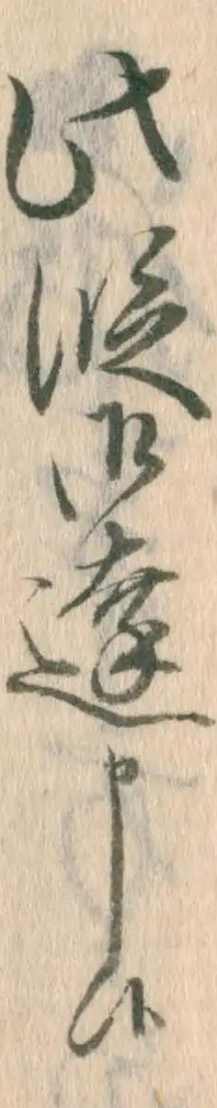此段御達申候
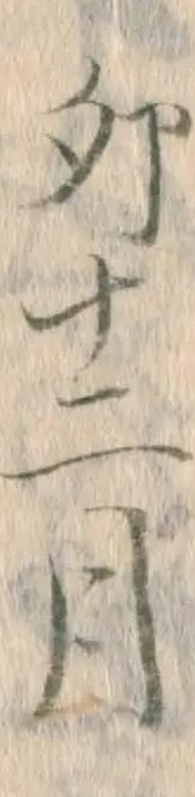卯十二月
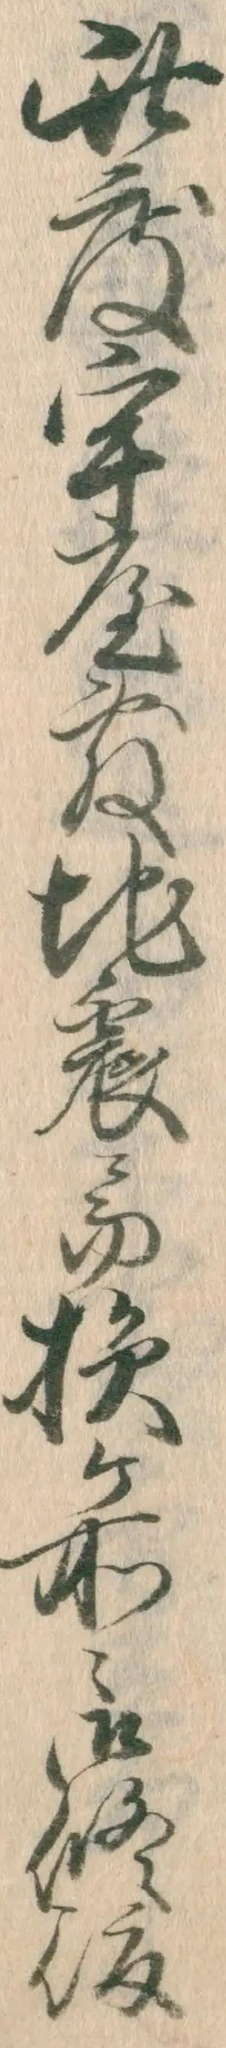此度牢屋敷地震ニて損ケ所之御修復
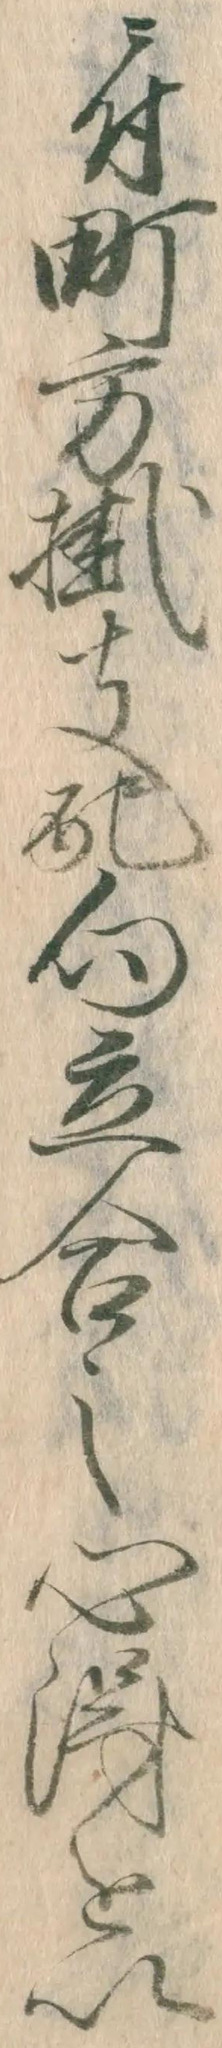ニ付町方掛支配向立合之心得を以

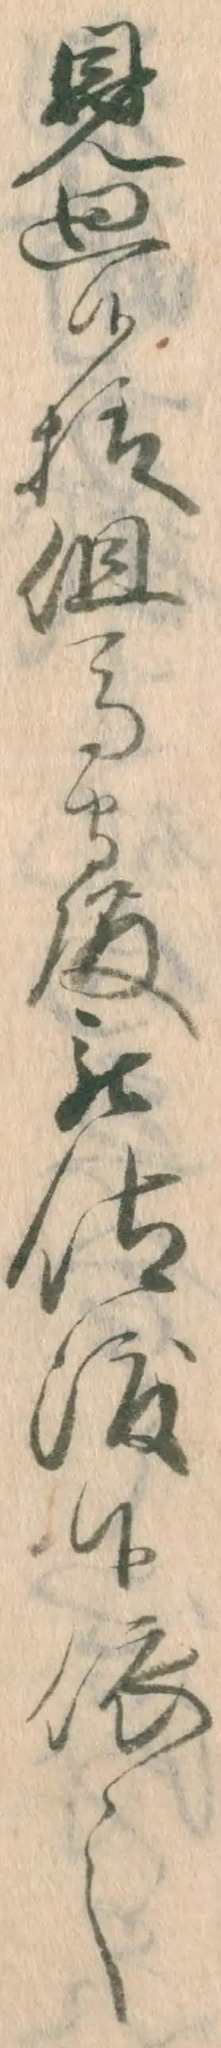見廻候様但馬守殿被仰渡候依之
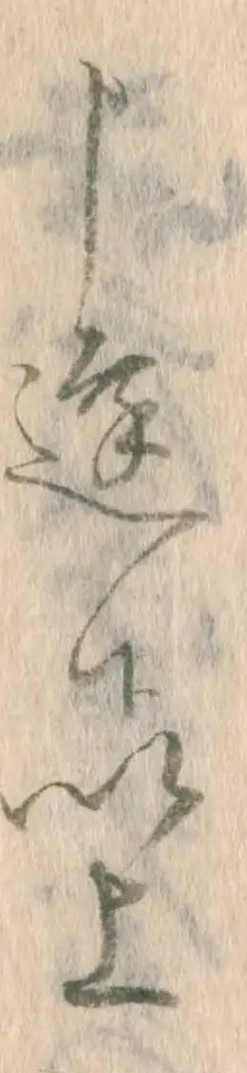申達候以上
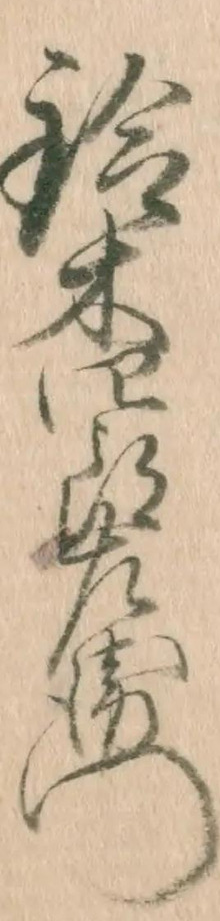鈴木四郎左衛門
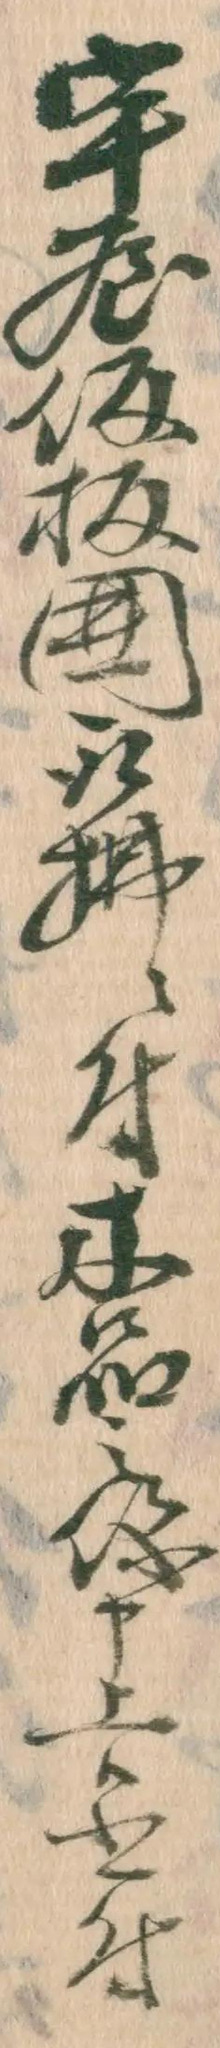│牢屋仮板囲取払ニ付木品之儀申上候書付
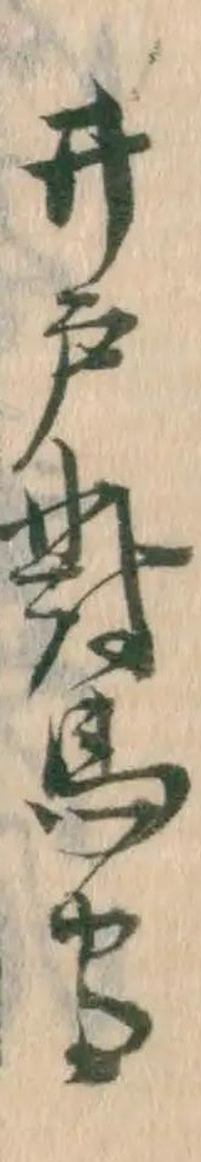│井戸対馬守
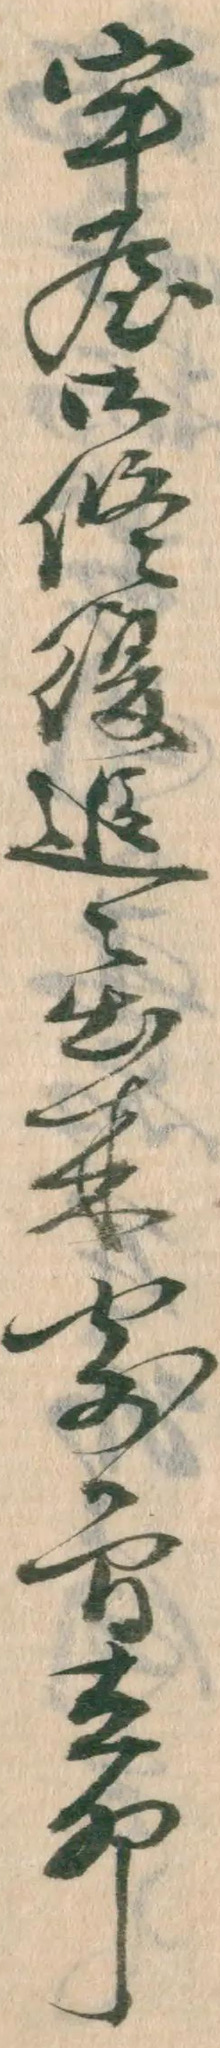牢屋御修復追〻出来寄候間去卯
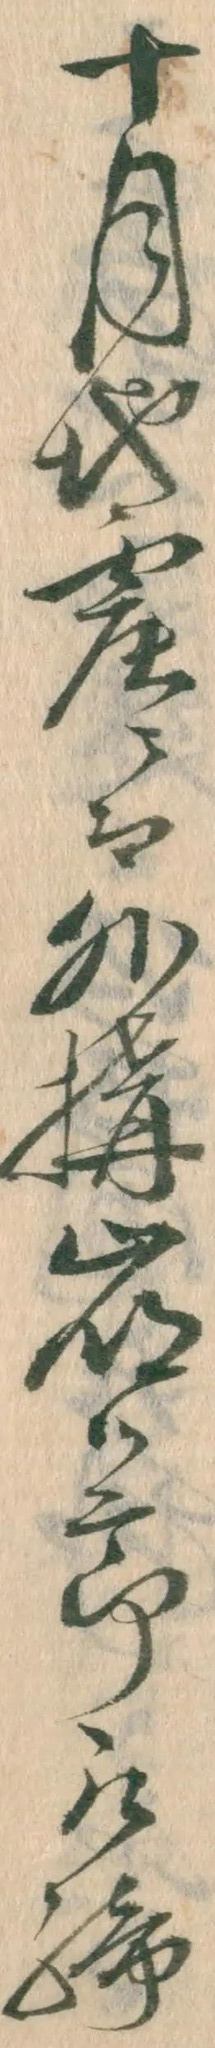十月地震ニて外構崩候節取締

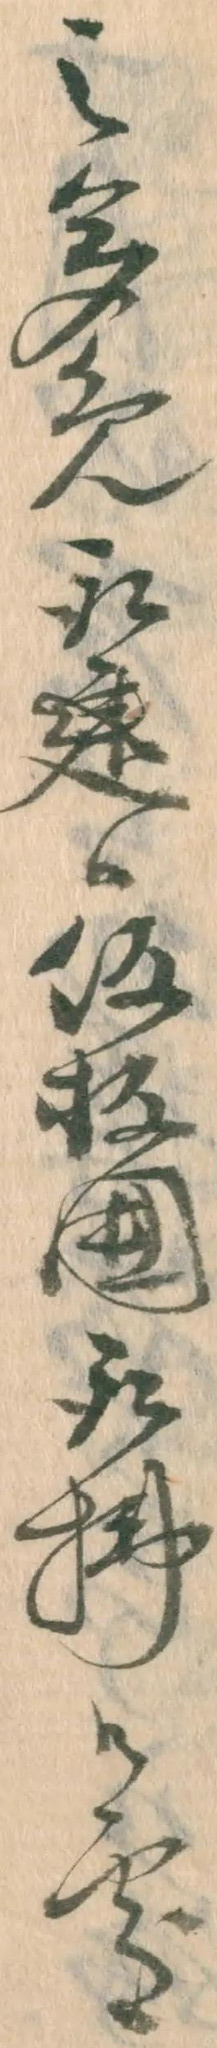之ため取建候仮板囲取払候処
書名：七十冊物類集 71巻. [44] 四十三 牢屋敷御普請御修覆地震ニ付骨折候牢屋掛御褒美之部
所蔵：国立国会図書館 National Diet Library, JAPAN
